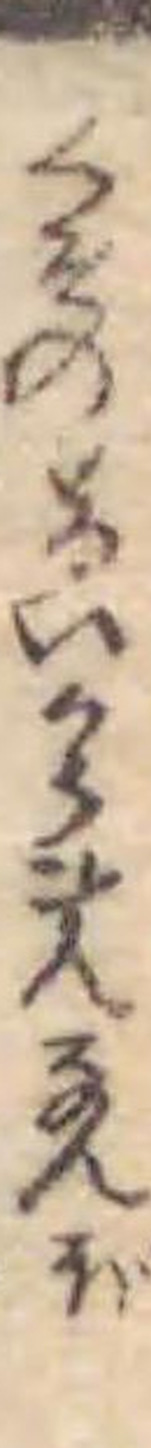くそのわるいかうまんなんぼ
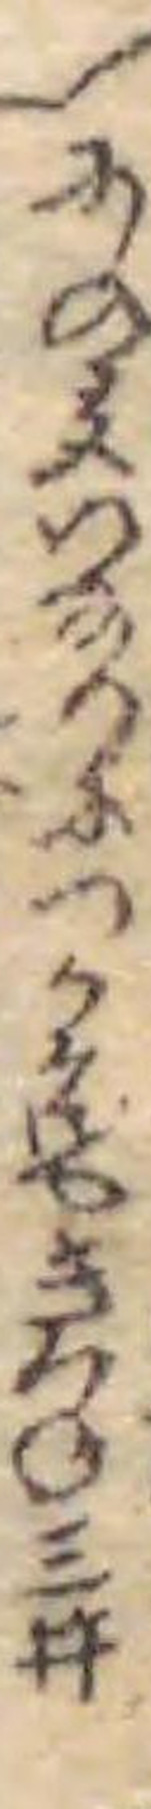にしの宮いなりにつかえるきつね三井
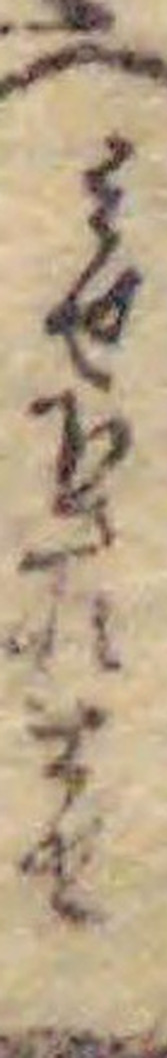みせ下されませ
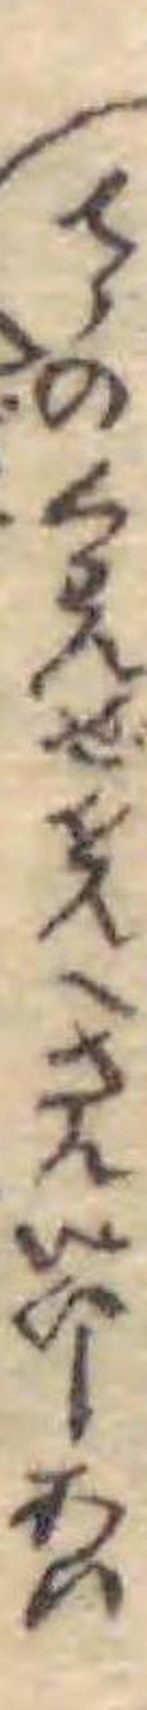てらのくわんぜをんへさんけいしあい
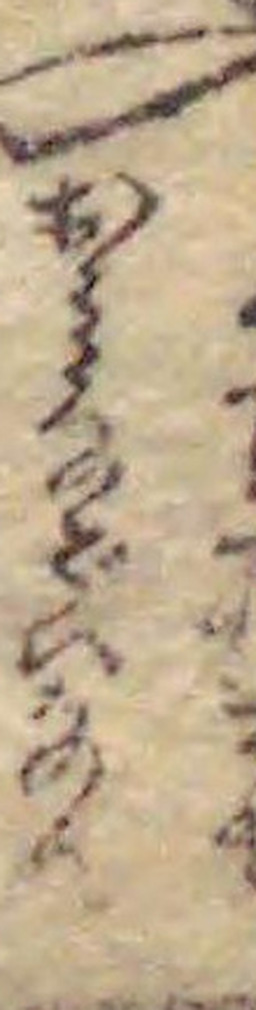おみゝなどはなん
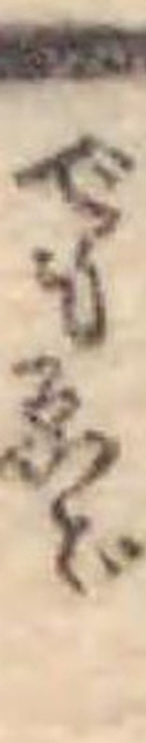でもゑど
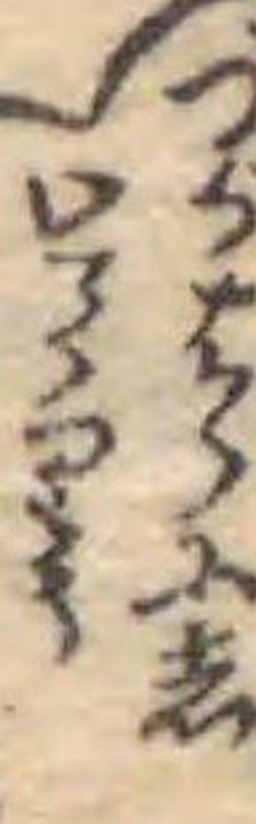とうりう
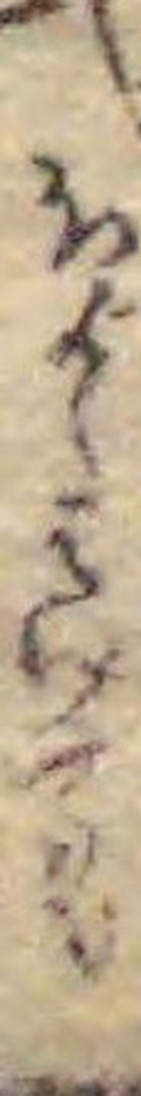ほよくはけても
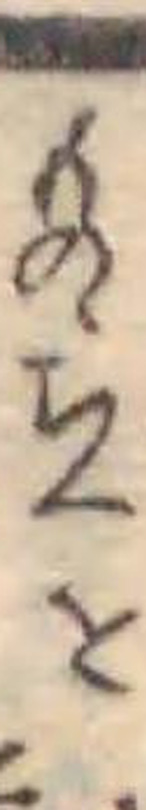ものゝちへを
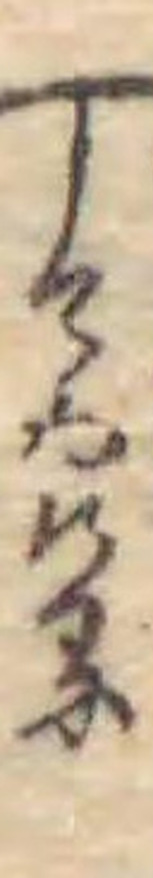してゐけるに
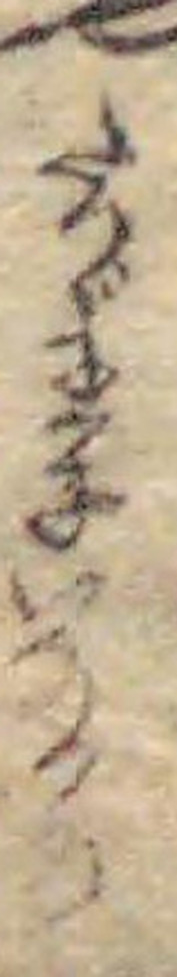たかゞ王子いなりの
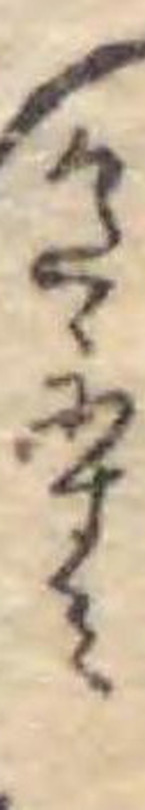かたくにすみ
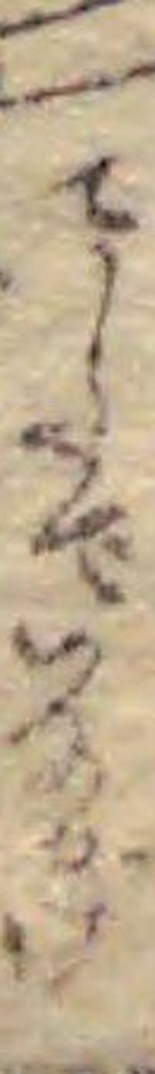てしたでいなかげ
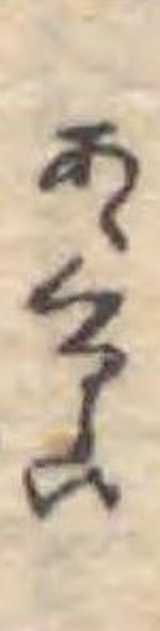あゝくるしい
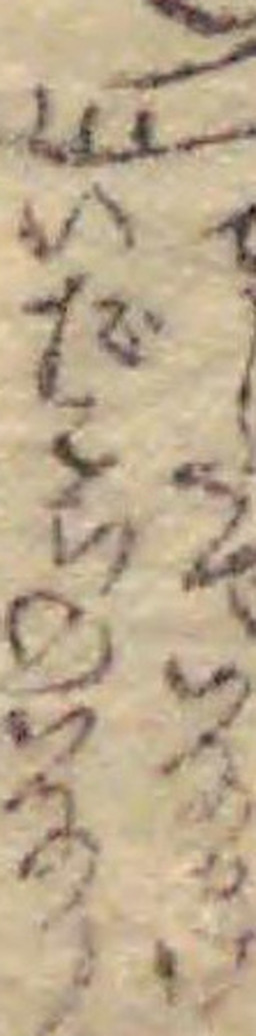いだこちのいなり
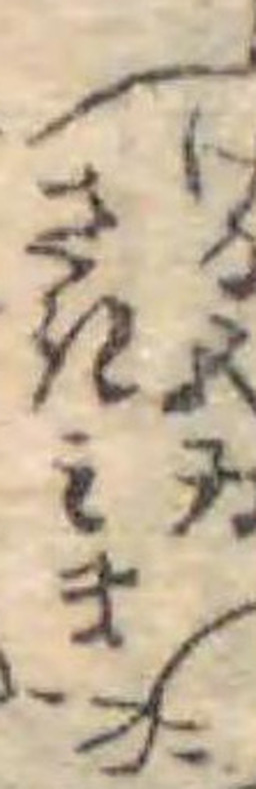さきみま
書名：鐘入七人化粧 : 3巻
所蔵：国立国会図書館 National Diet Library, JAPAN
